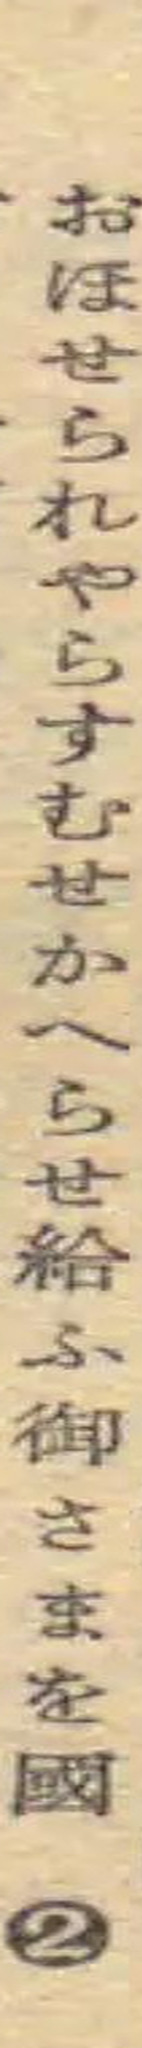おほせられやらすむせかへらせ給ふ御さまを国➋
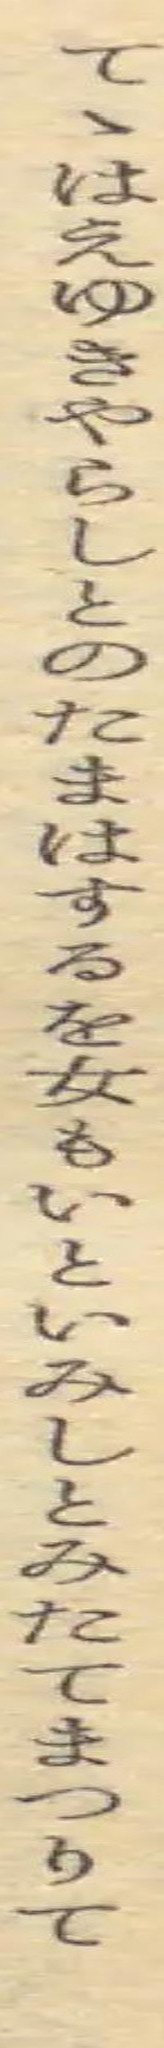てゝはえゆきやらしとのたまはするを女もいといみしとみたてまつりて
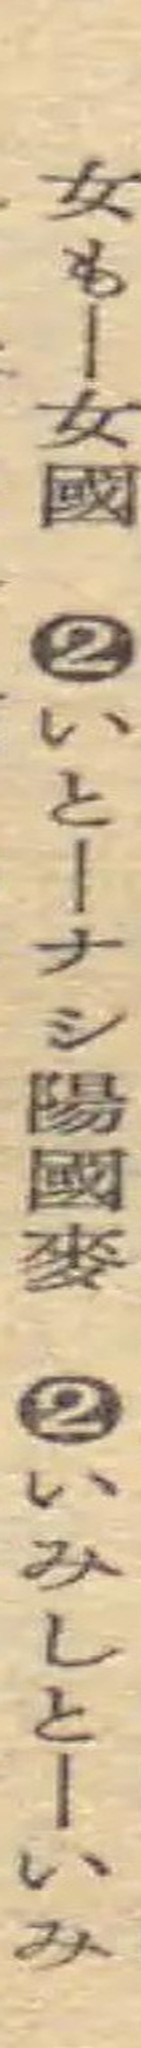女も―女国➋いと―ナシ陽国麦➋いみしと―いみ
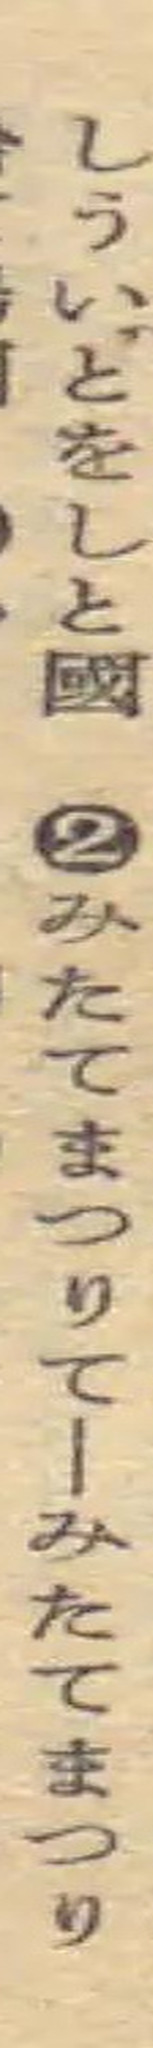しういとをしと国➋みたてまつりて―みたてまつり
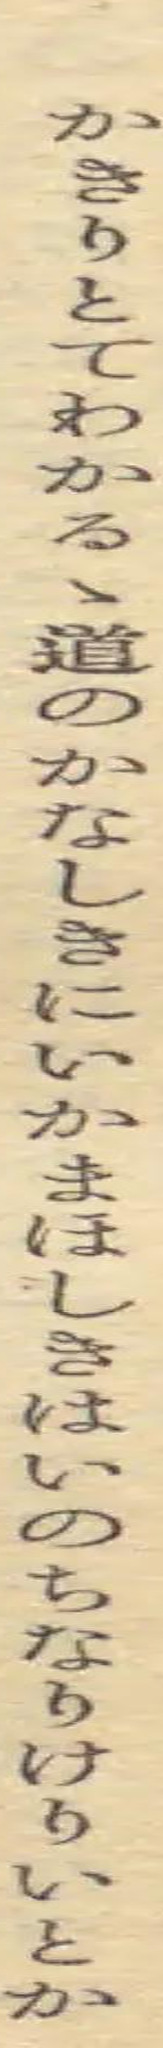かきりとてわかるゝ道のかなしきにいかまほしきはいのちなりけりいとか
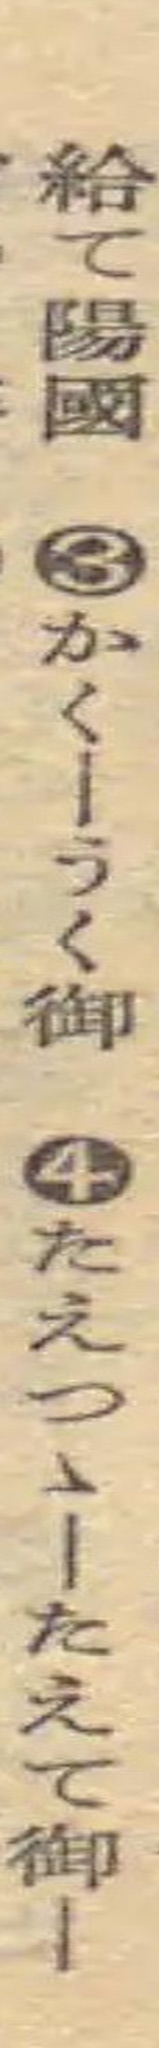給て陽国❸かく―うく御❹たえつゝ―たえて御―
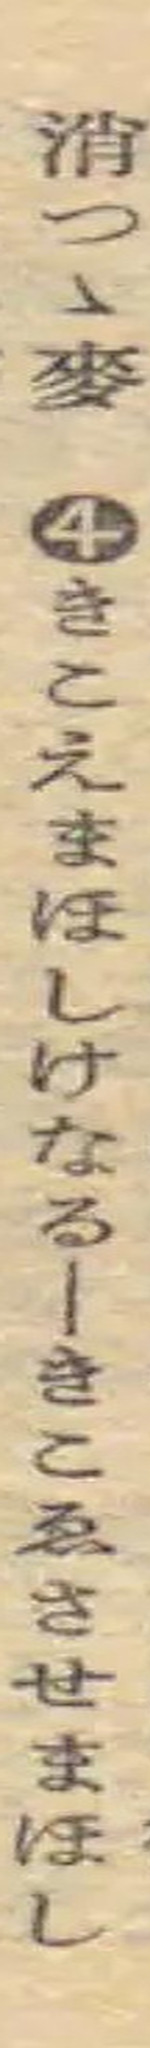肖つゝ麦❹きこえまほしけなる―きこゑさせまほし
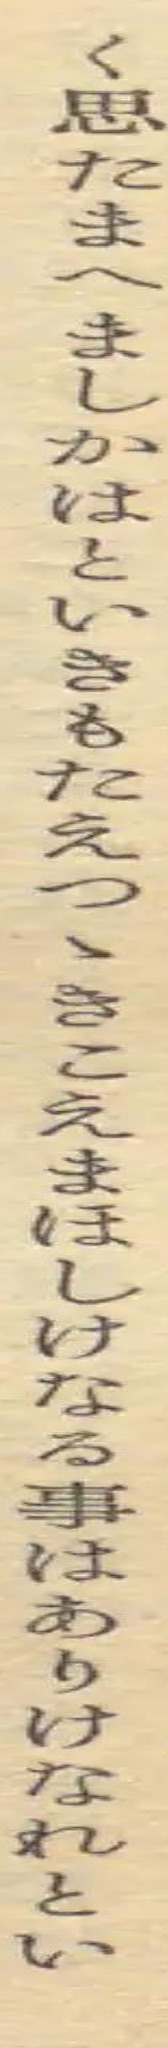く思たまへましかはといきもたえつゝきこえまほしけなる事はありけなれとい
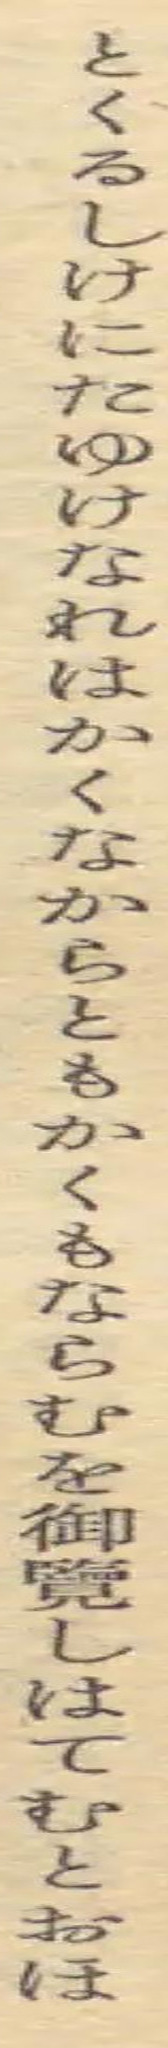とくるしけにたゆけなれはかくなからともかくもならむを御覧しはてむとおほ
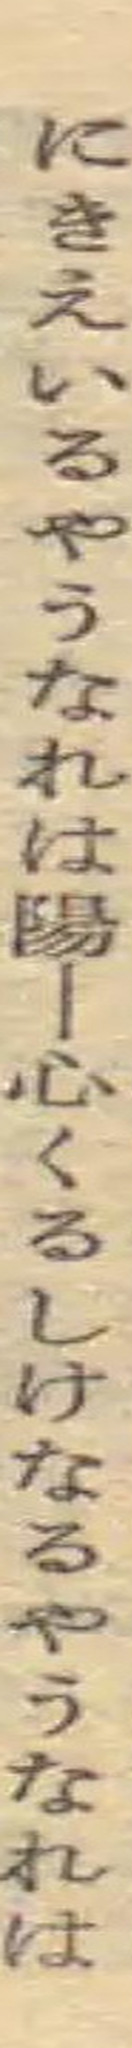にきえいるやうなれは陽―心くるしけなるやうなれは
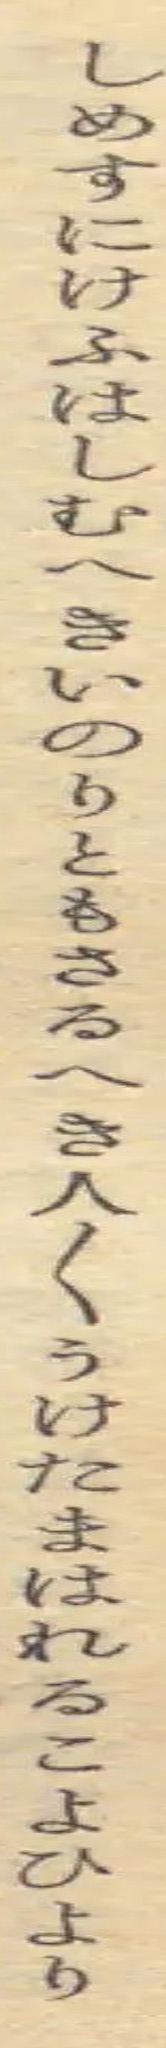しめすにけふはしむへきいのりともさるへき人〳〵うけたまはれるこよひより
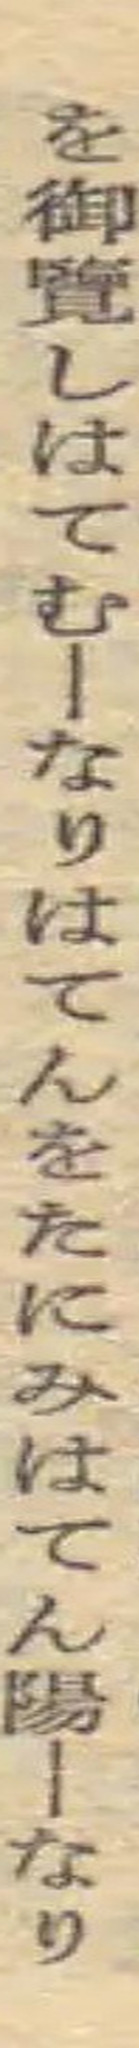を御覧しはてむ―なりはてんをたにみはてん陽―なり
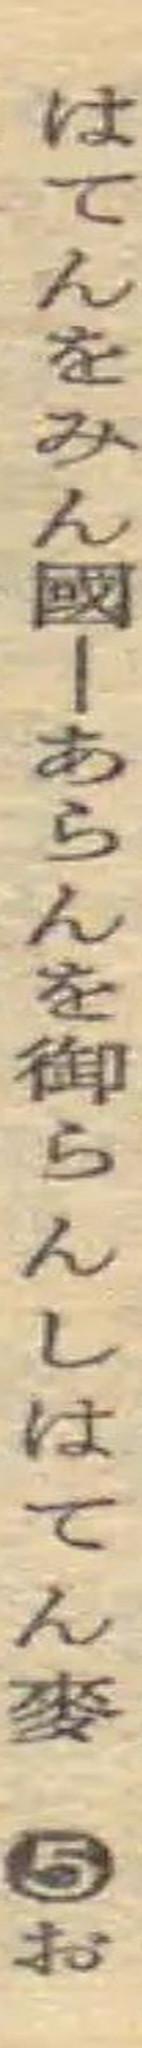はてんをみん国―あらんを御らんしはてん麦❺お
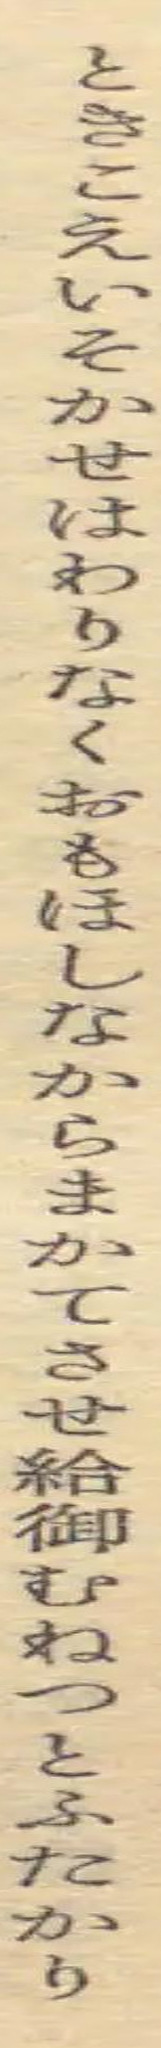ときこえいそかせはわりなくおもほしなからまかてさせ給御むねつとふたかり
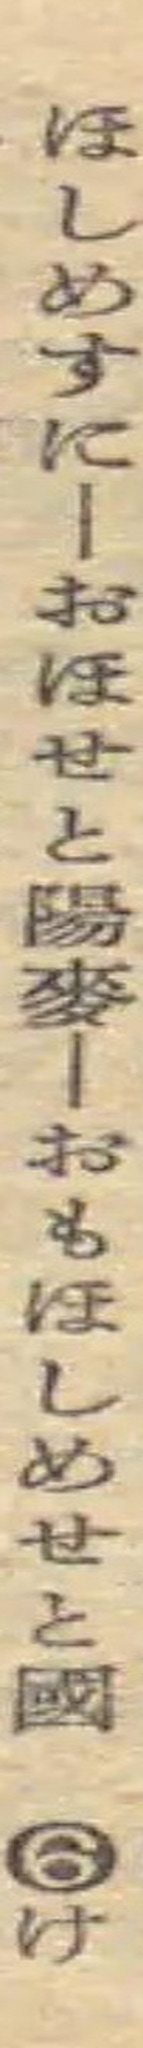ほしめすに―おほせと陽麦―おもほしめせと国❻け
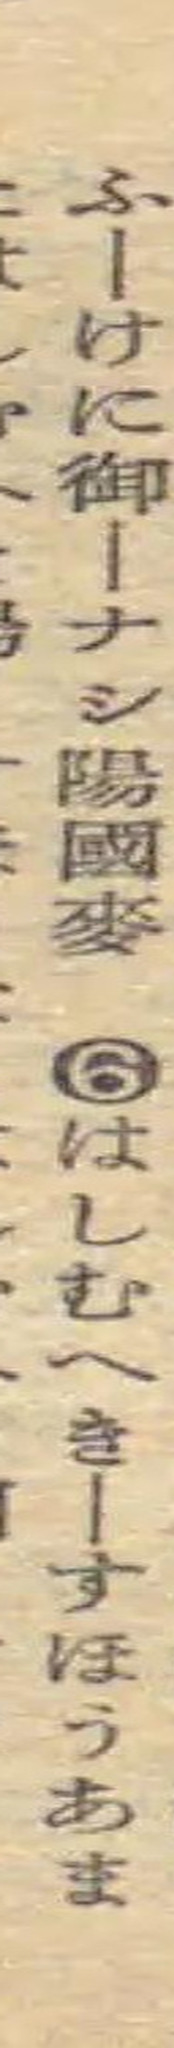ふ―けに御―ナシ陽国麦❻はしむへき―すほうあま
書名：校異源氏物語.
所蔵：国立国会図書館 National Diet Library, JAPAN
